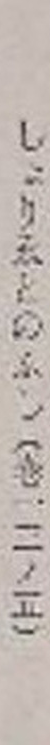しよりゑとのふし(巻一三ノ五)
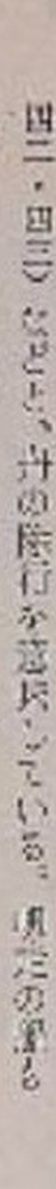四二・四三)などと、舟の除行を意味している。帆走の船も
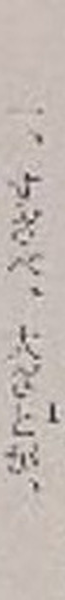一、すざべ、大ざとが、
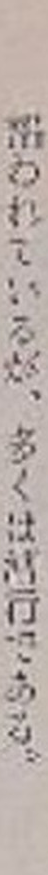謡われているが、多くは行である。
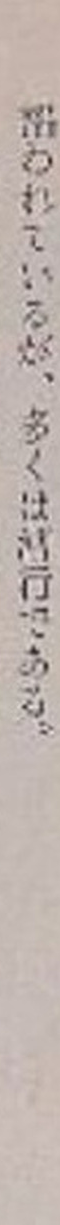謡われているが、多くは行である。
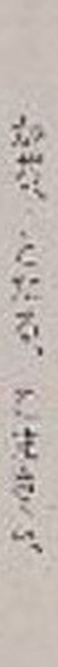かぢ、とたる、こまさよ、
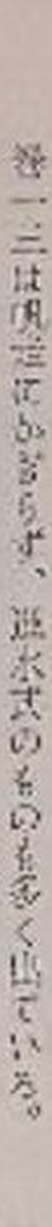巻一三は帆走にかぎらず、進水式のものも多く出ている。
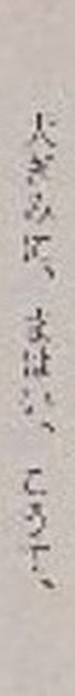大ぎみに、まはい、こうて、
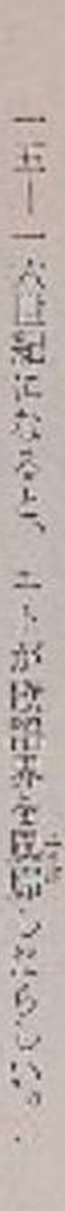一五―一六世紀になると、エトが歌謡界を風靡したらしい。
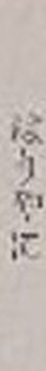はりやに
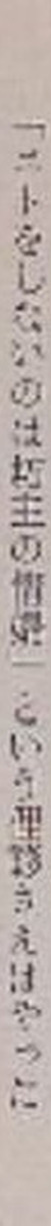「エトをしないのは王の」という俚諺さえはやった
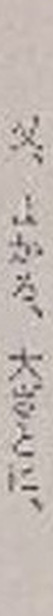又、よかる、大ざとに、
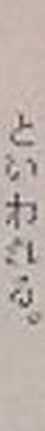といわれる。
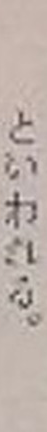といわれる。
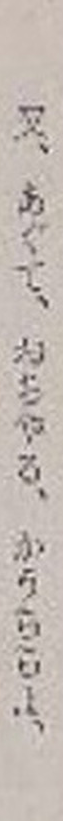又、あぐて、おちやる、かうちちよ、
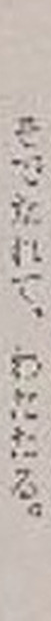そでたれて、わたたる。
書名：沖縄口承文芸
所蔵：University of the Ryukyus Library
